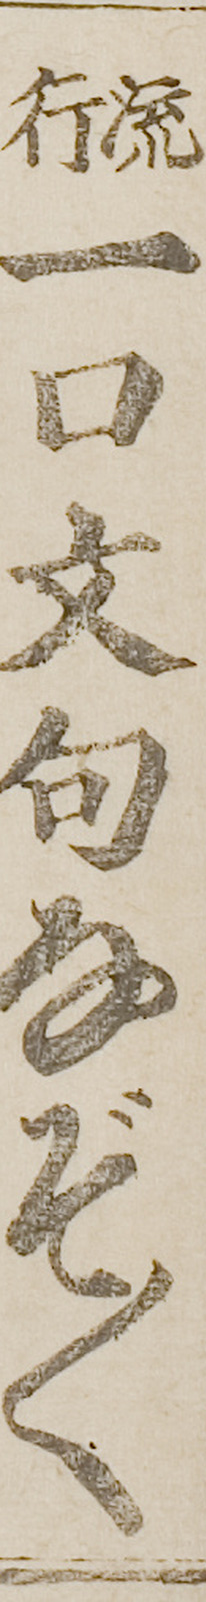流行一口文句なぞ〳〵
